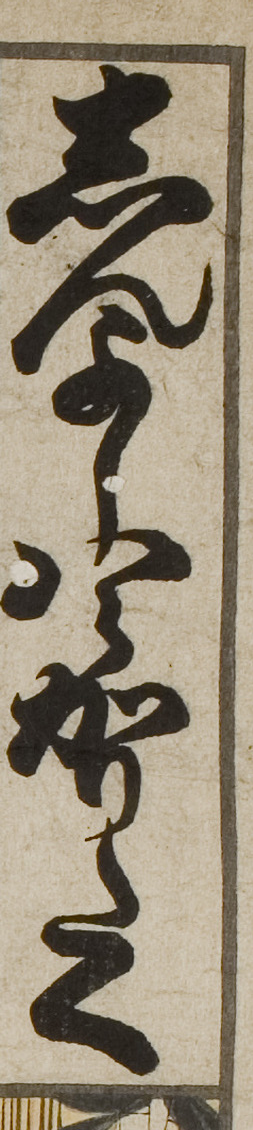志んよしハらかりたく
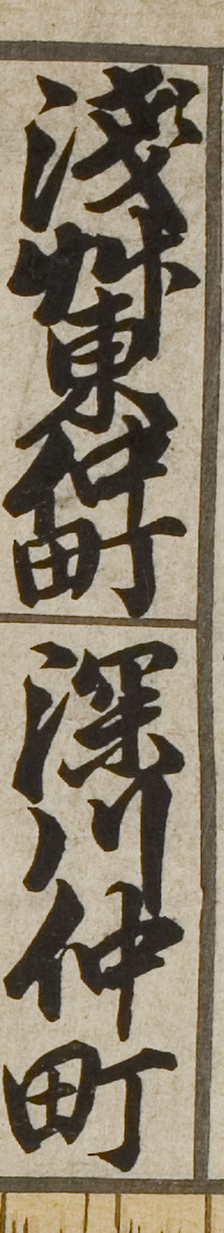浅艸東仲町深川仲町
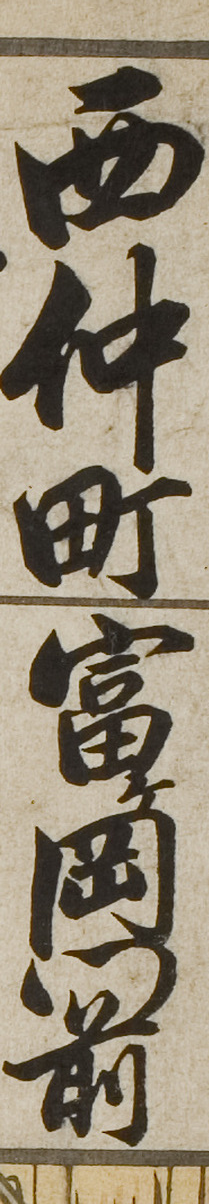西仲町富ヶ岡門前
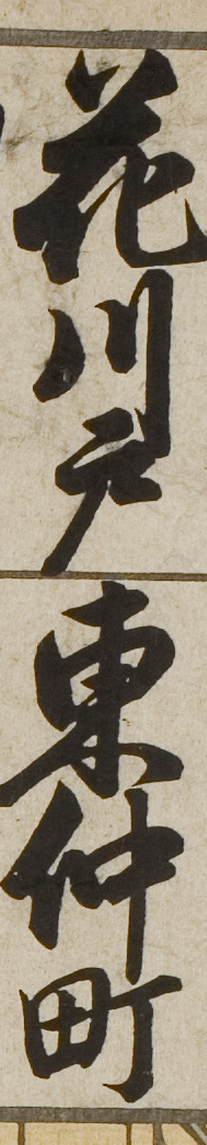花川戸東仲町
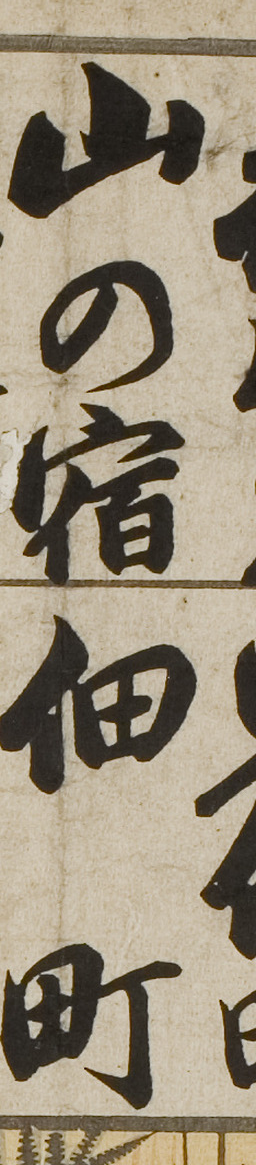山の宿佃町
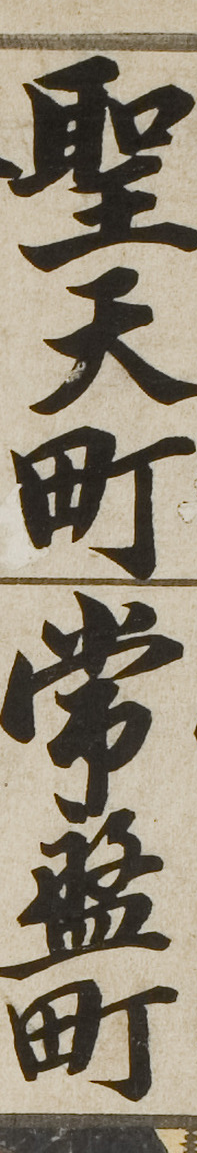聖天町常盤町
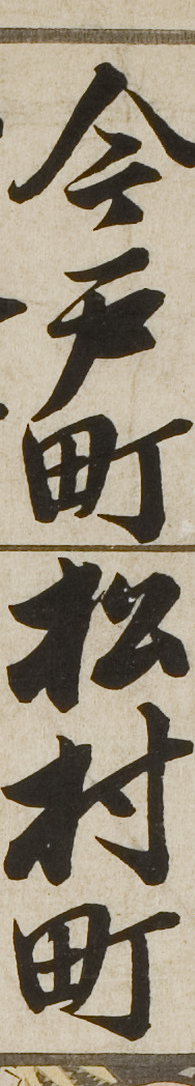今戸町松村町
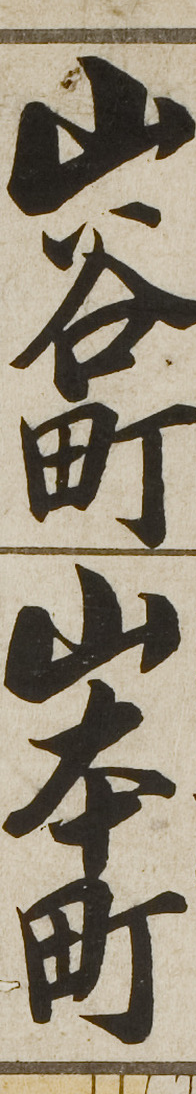山谷町山本町
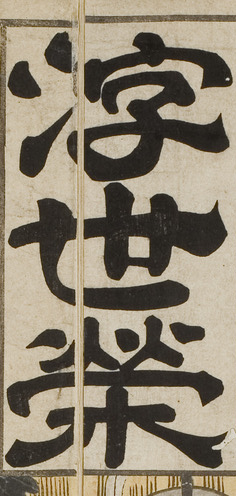浮世榮
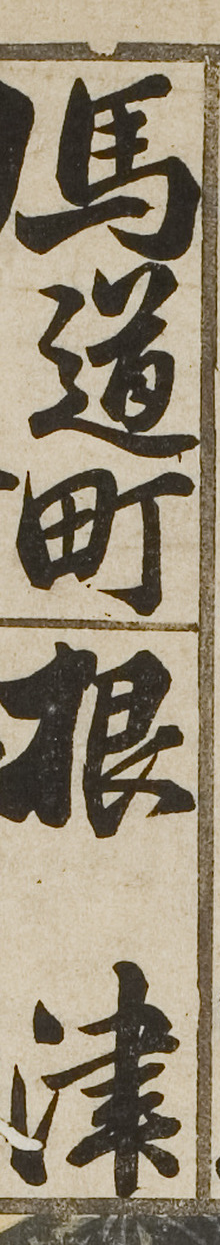馬喰町根津
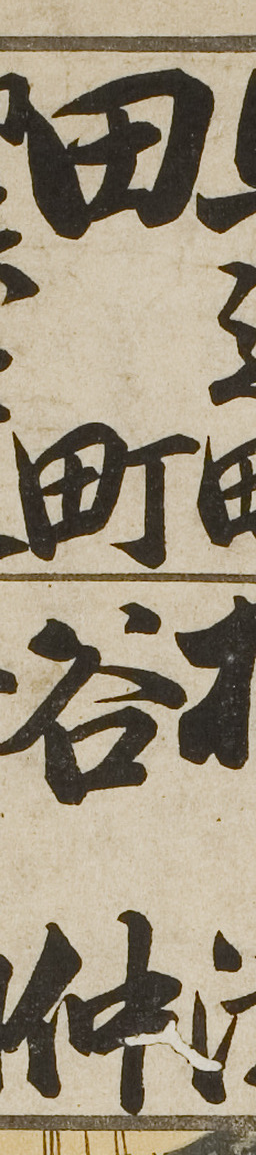田町谷仲
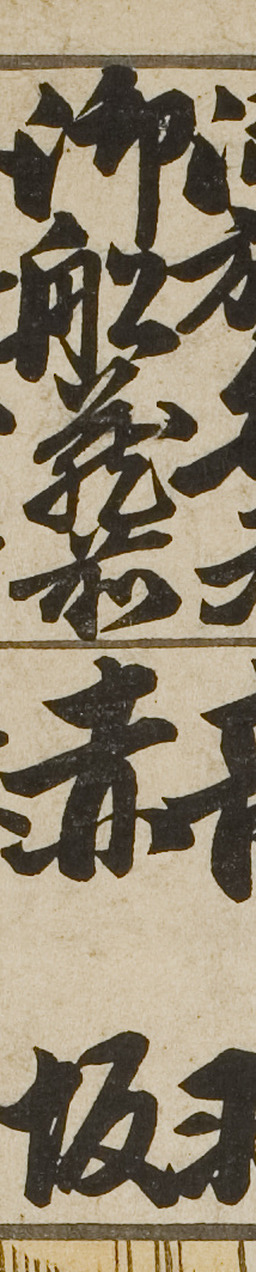御船蔵前赤坂
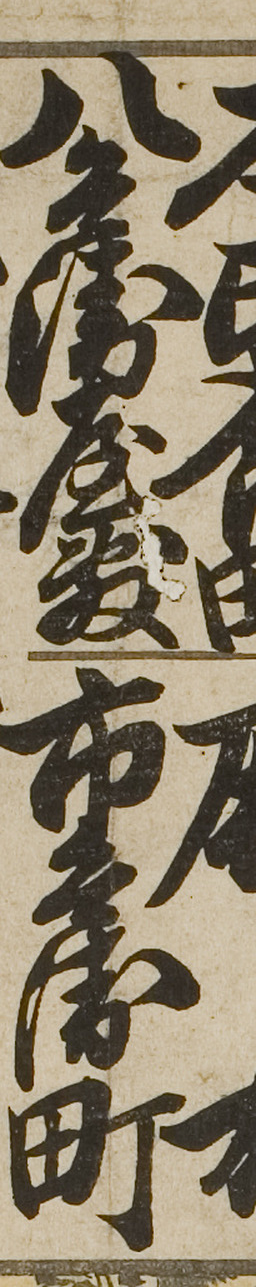八兵衛屋敷市兵衛町
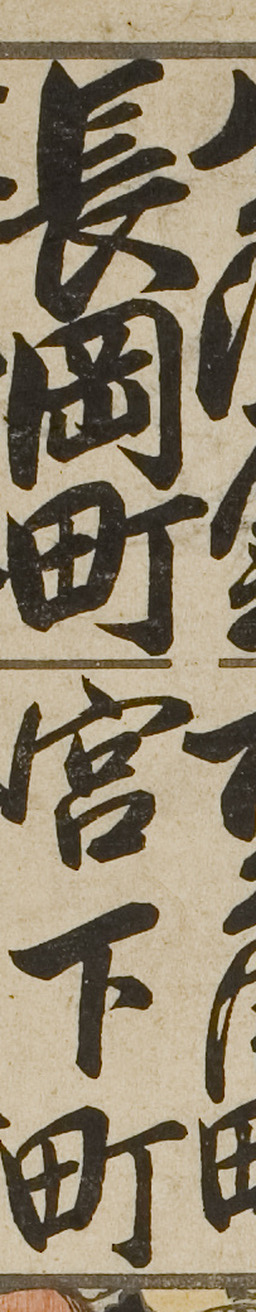長岡町宮下町
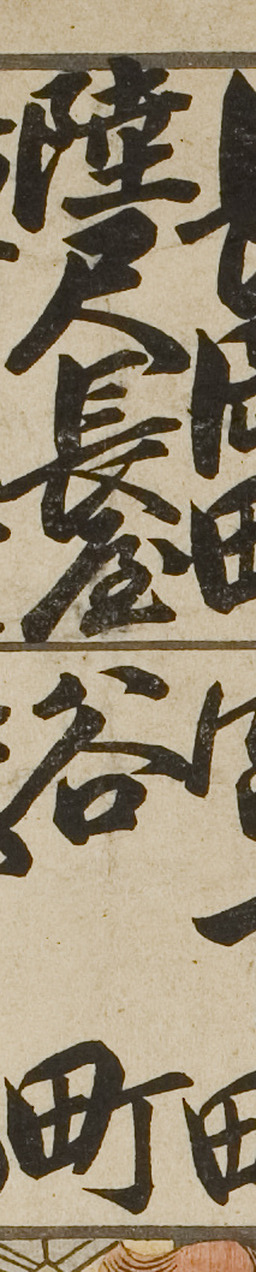陸尺長屋谷町
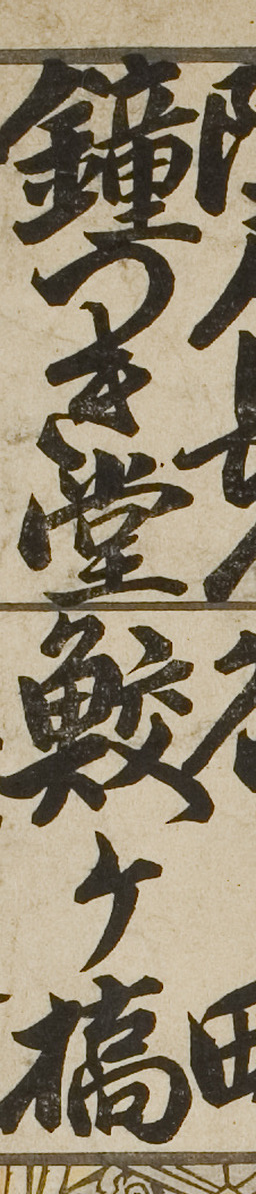鐘つき堂鮫ヶ橋
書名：浮世栄 しんよしハらかりたく
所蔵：東京大学総合図書館 General Library in the University of Tokyo, JAPAN
